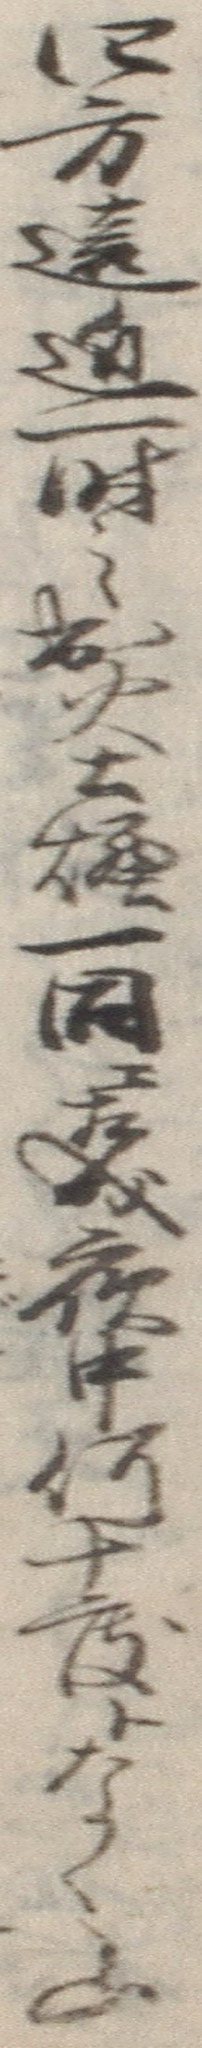四方遠近一時之出火土煙一同ニ相成夜中何十度トなく山
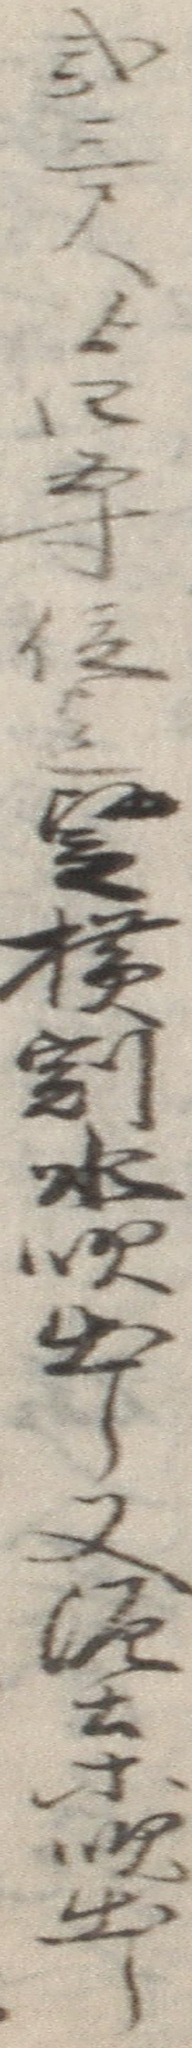或三尺ゟ四五寸位迄竪横割水吹出し又泥土等吹出し
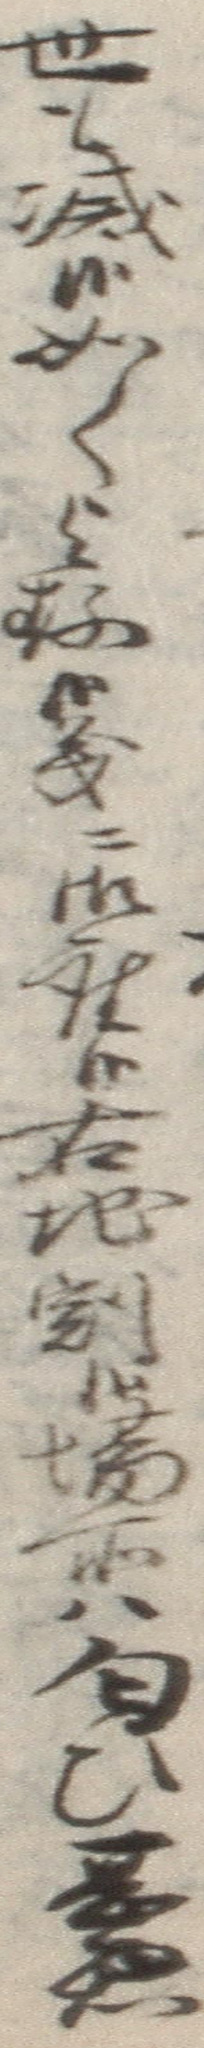世も減候如くと存候義ニ御座候右地割候場所ハ匂ひ甚悪
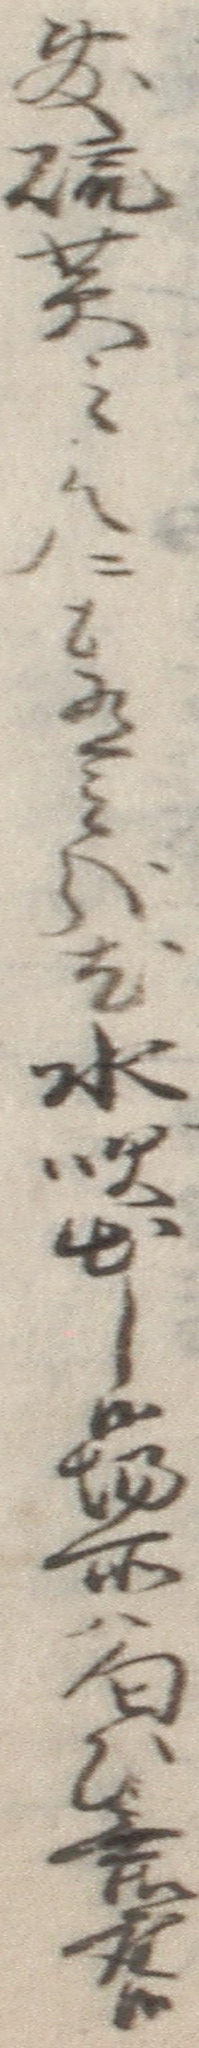敷硫黄之気ニも有之哉尤水吹出し候場所ハ匂ひ無御座候
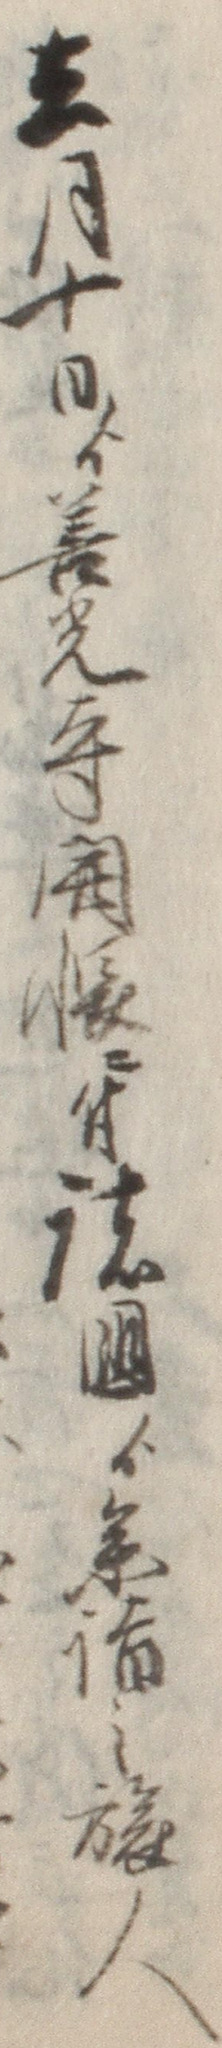一去月十日ゟ善光寺開帳ニ付諸国ゟ参詣之旅人
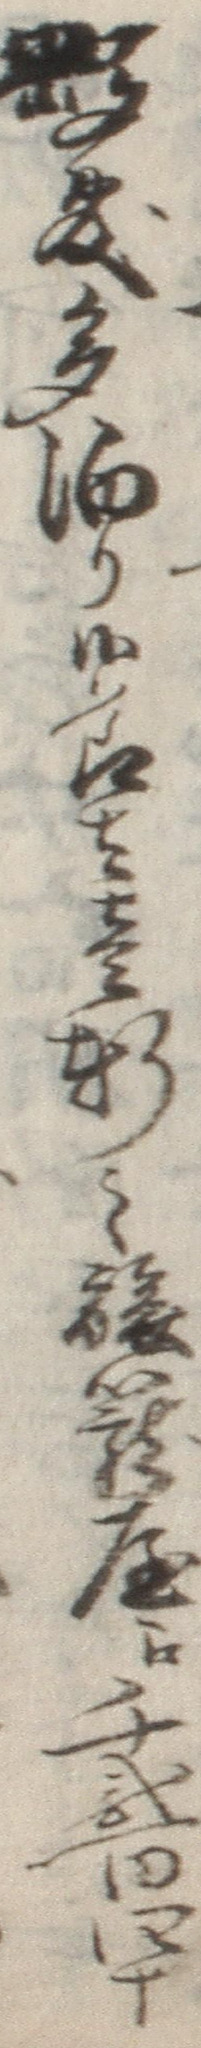夥敷多泊り候節は壱軒之旅籠屋え百千弐百四十
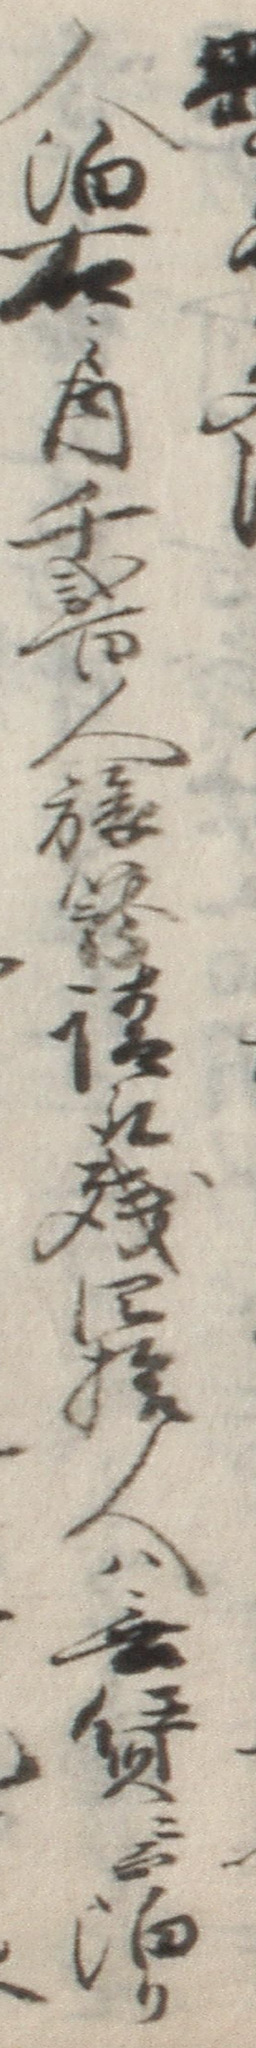人泊右之内千弐百人旅籠請取残四拾人ハ無賃ニ而泊り
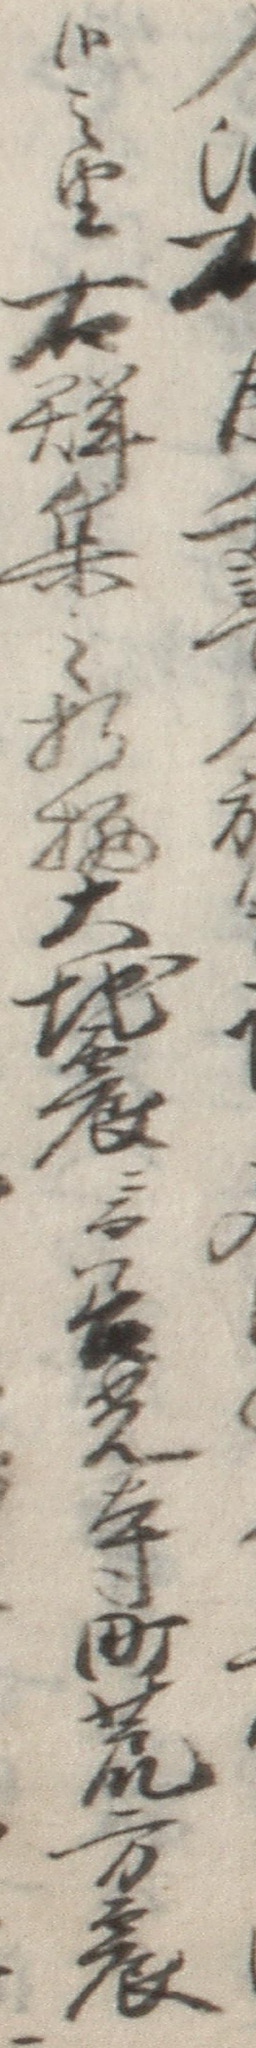候之由右群衆之折柄大地震ニ而善光寺町荒方震
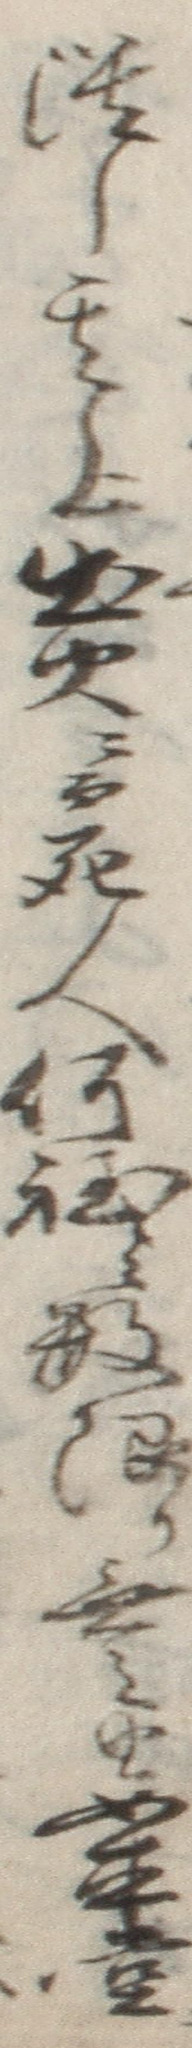潰し其上出火ニ而死人何程之数限り無之由如来堂ニ
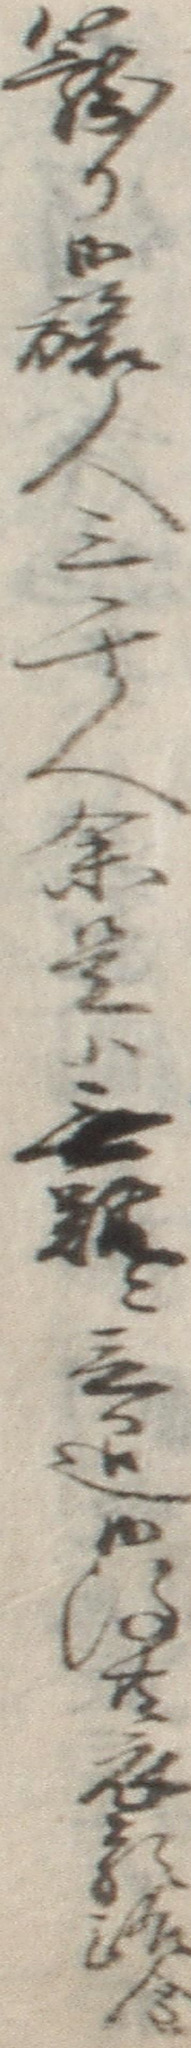籠り候旅人三千人余是ハ無難ニ立退候得共衣類路銀

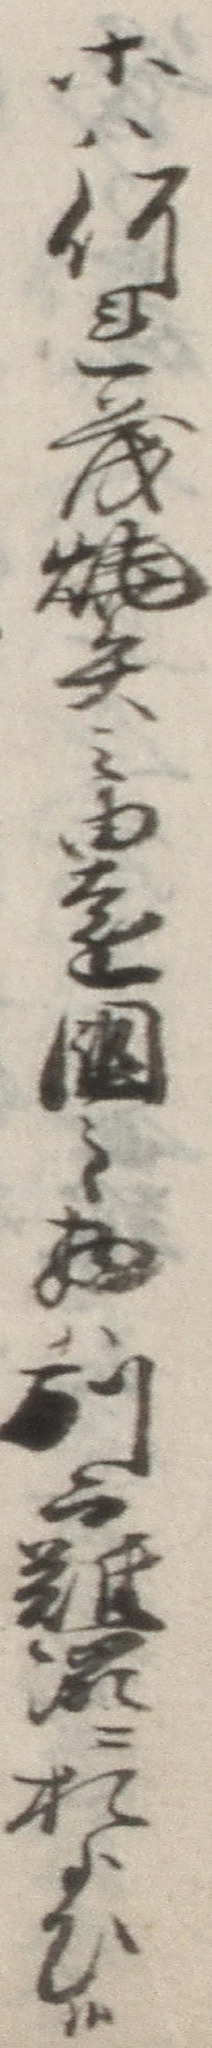等ハ何れも焼失之由遠国之物ハ別而難渋ニおよひ候
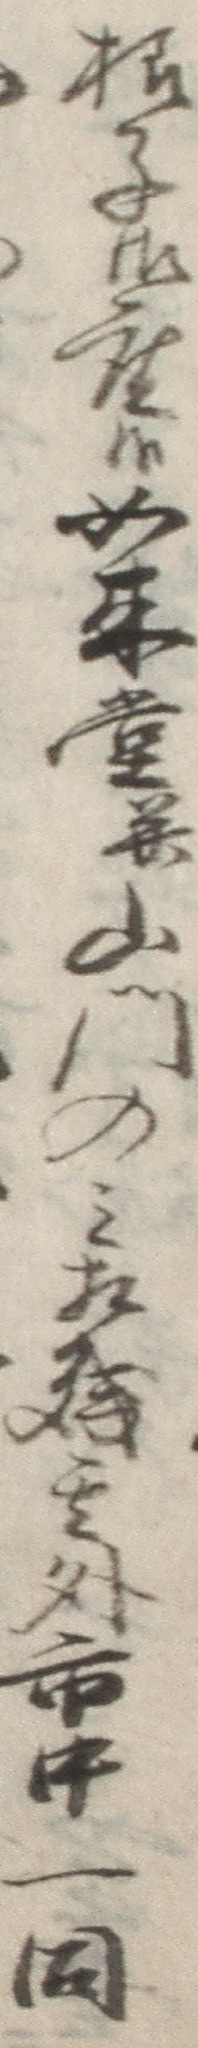様子御座候如来堂并山門のミ相残其外市中一同
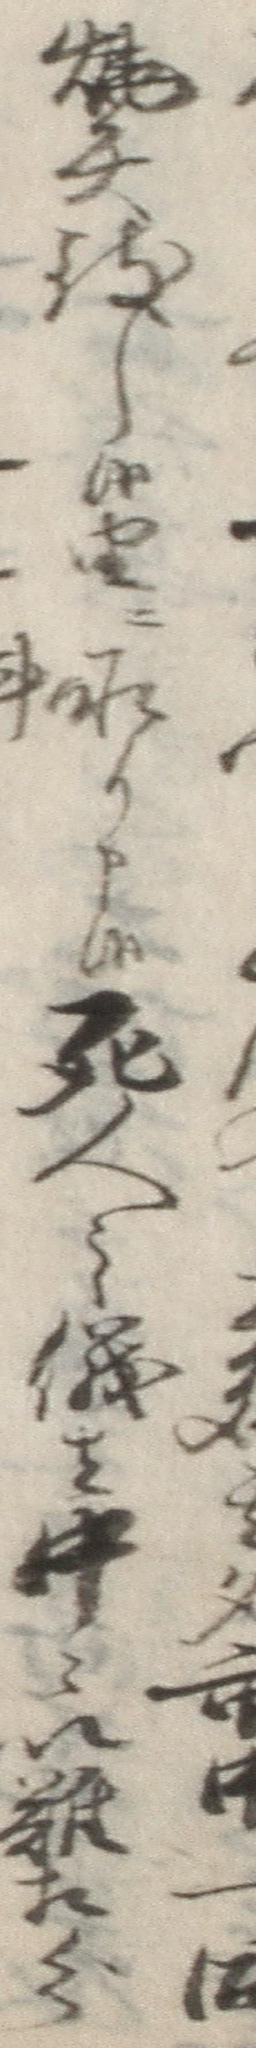焼失致し候由ニ承り申候死人之儀は中々以難相分
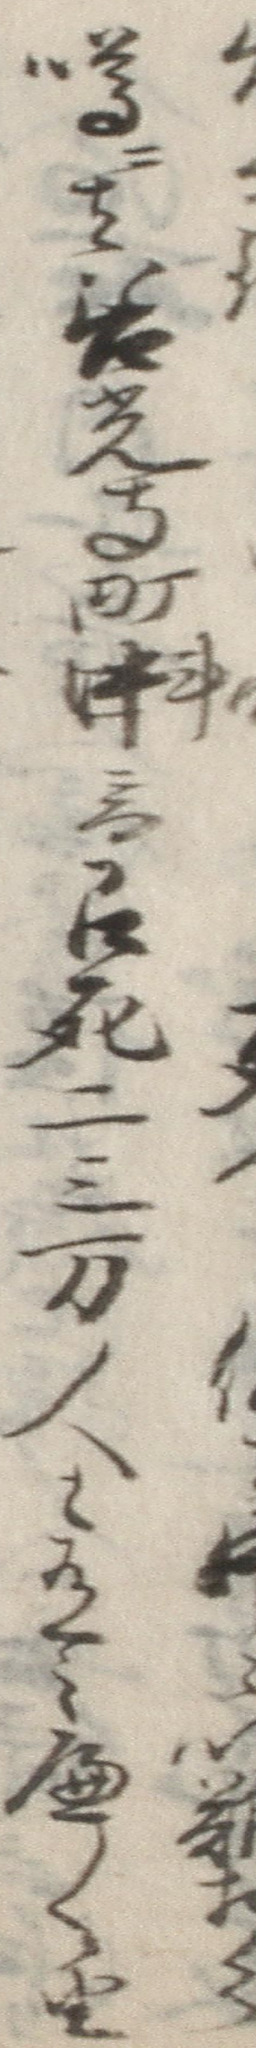噂ニは善光寺町料ニ而即死二三万も有之へく由
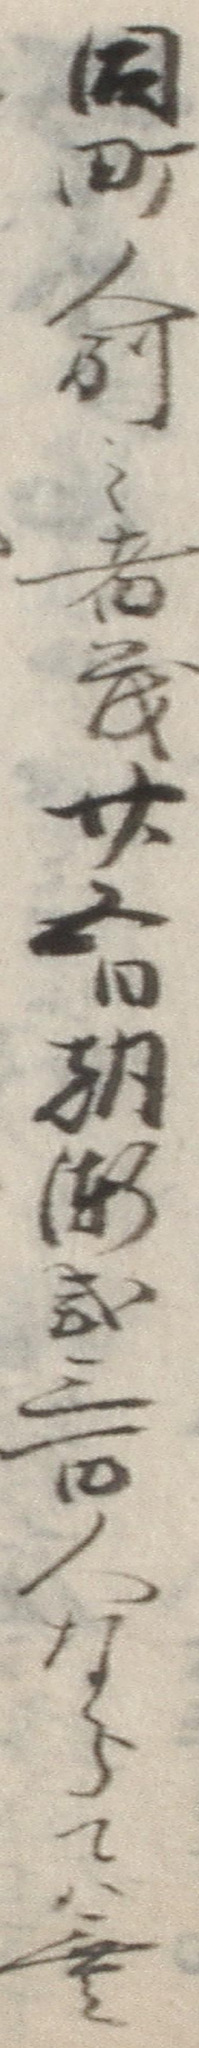同町人別之者も廿五日朝漸或弐三万人ならてハ無之
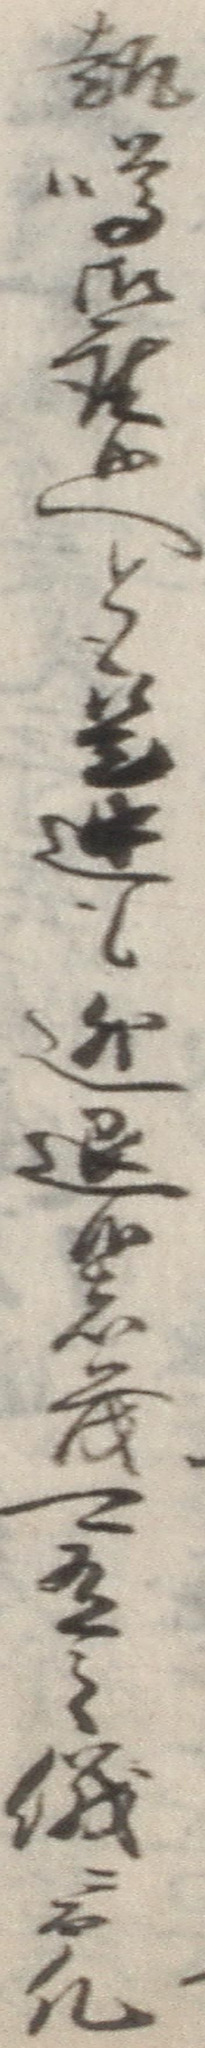趣噂御座候へとも是迚も逃退候者も可有之儀ニ而凡
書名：[善光寺地震に関する冊子]
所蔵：東京大学地震研究所図書室 Earthquake Research Institute Library, The University of Tokyo, JAPAN
